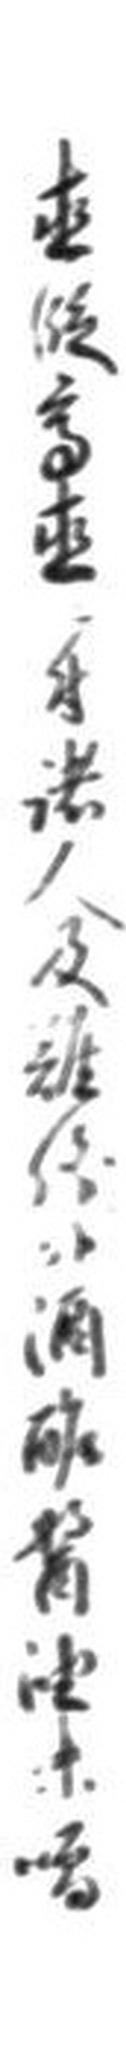直段高直ニ付諸人及難儀候酒酢醬油味噌
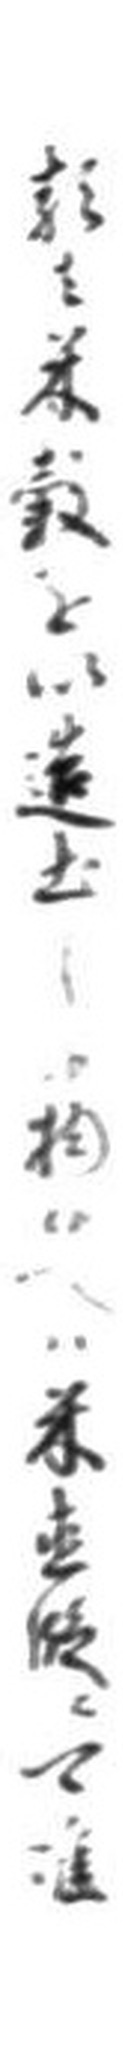類者米穀を以造出し候物候ヘハ米直段ニ可准
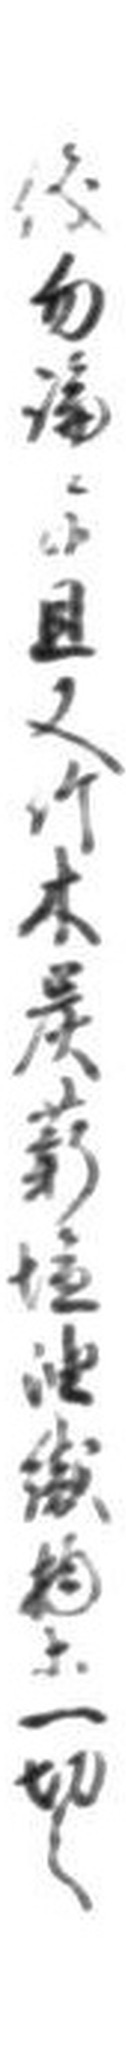儀勿論ニ候且又竹木炭薪塩油織物等一切之
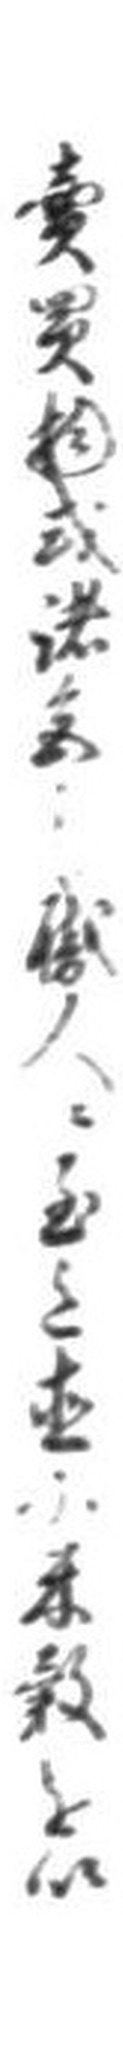売買物或諸色之職人ニ至迄直に米穀を以
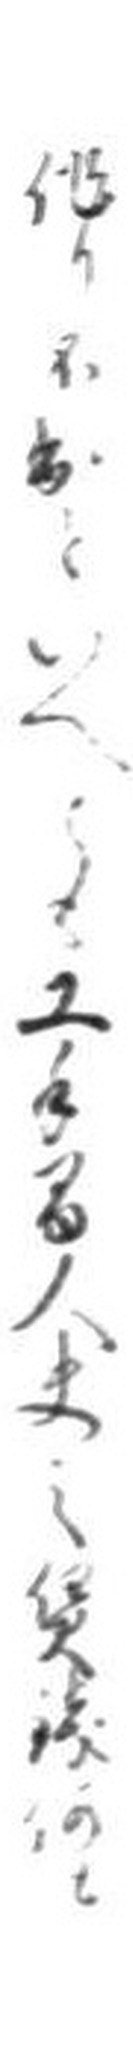作り不出といへとも工手間人夫之賃銭何も
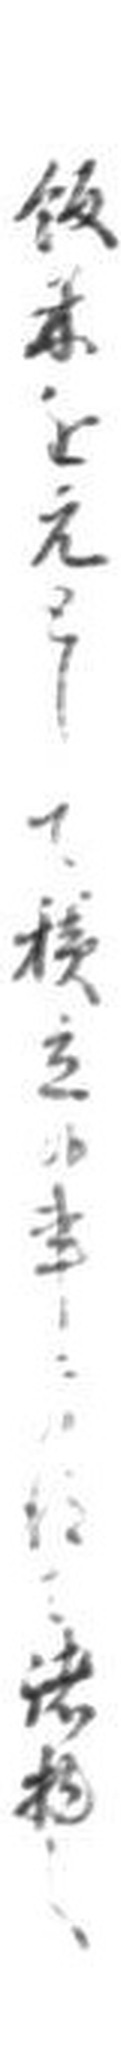飯米を元として積立候事ニ候得者諸物之
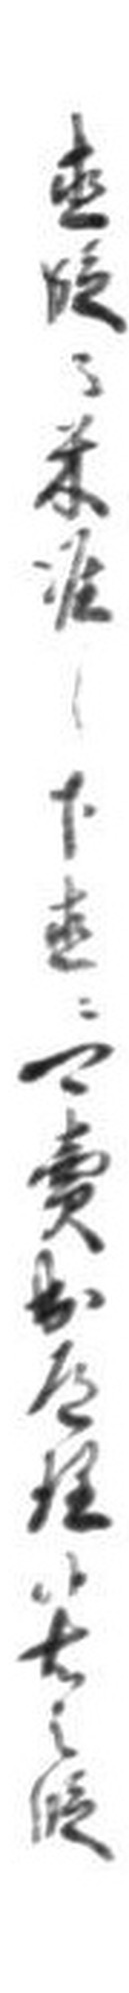直段も米准し下直ニ可売出道理候右之段
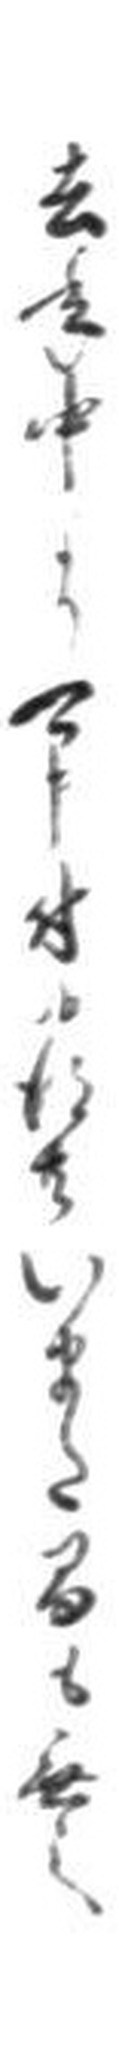去年中より可申付候得共いまた間も無之

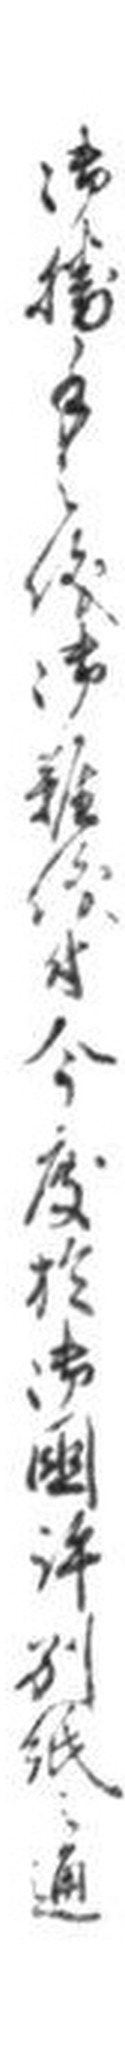御勝手之儀御難儀付今度於御国許別紙之通
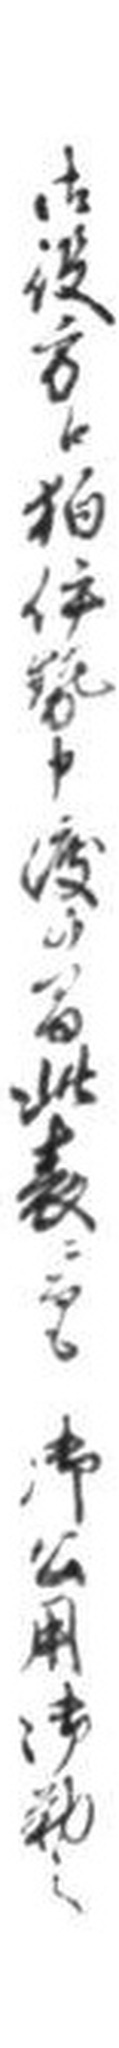御役方江狛伊勢申渡候間此表ニ而も御公用御勤之
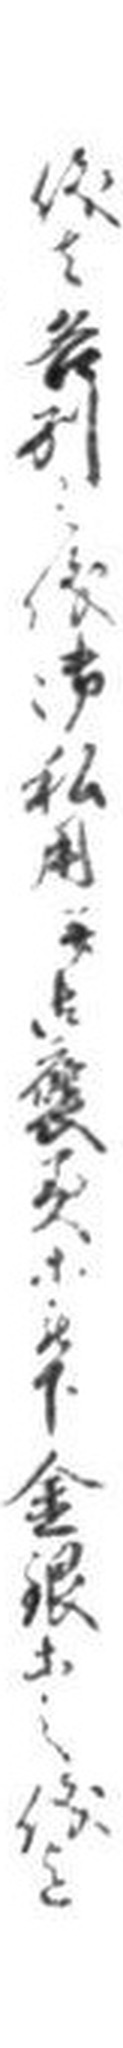儀者各別之儀御私用并御褒美等被下金銀等之儀迄
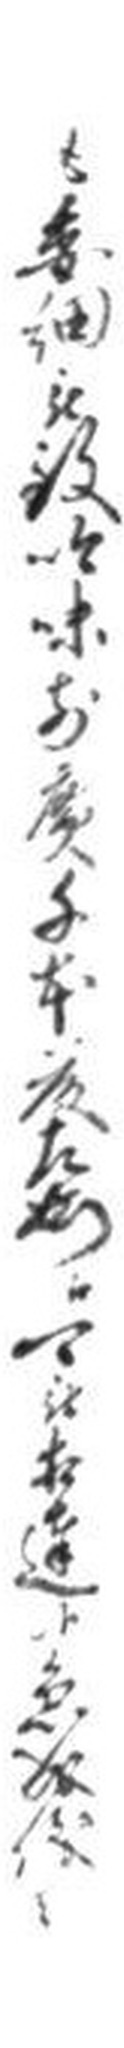も委細被致吟味前広千本藤左衛門へ可被相達候急成儀者
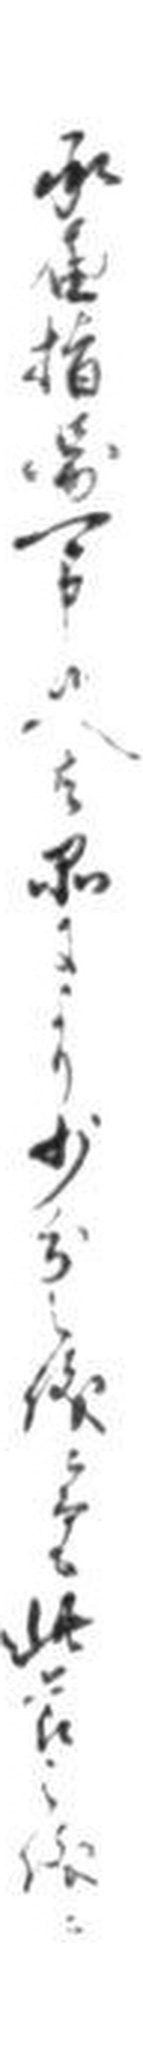承届指図可申候へ共品により少分之儀ニ而も此節之儀ニ
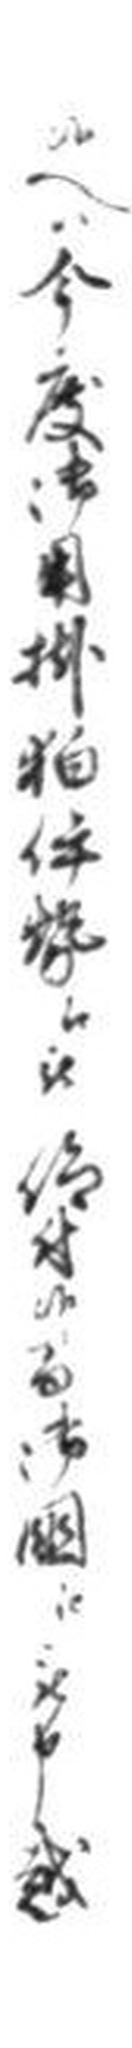候ヘハ今度御用掛狛伊勢江被仰付候間御国江被申越
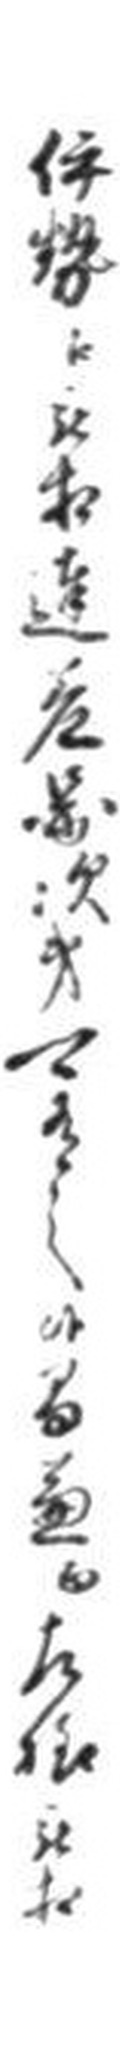伊勢江被相達差図次第可有之候間兼而左様被相
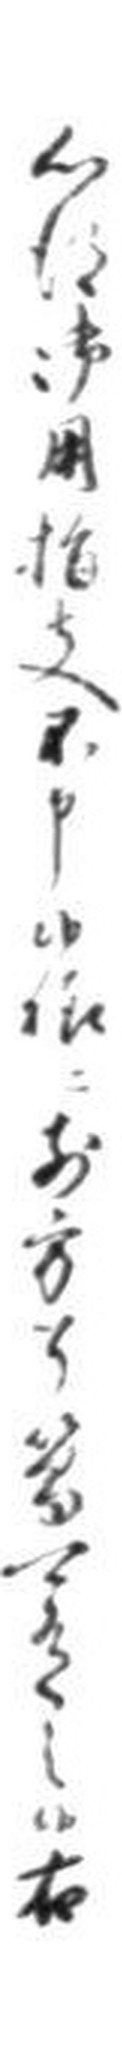心得御用指支不申候様ニ前方了簡可有之候右
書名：家譜 三十六 宗昌公 従享保八年到同九年
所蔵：福井県文書館 Fukui Prefectural Archives
